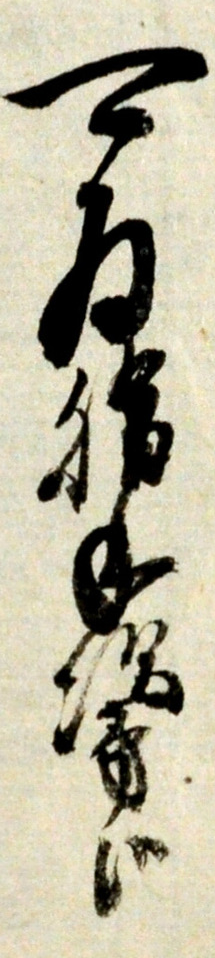可為勝手次第候
